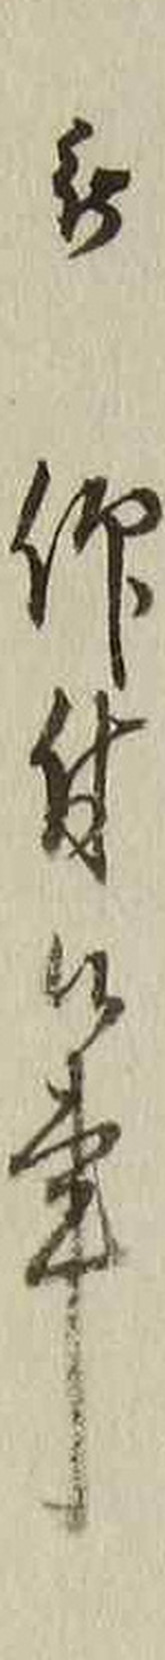被仰付候事
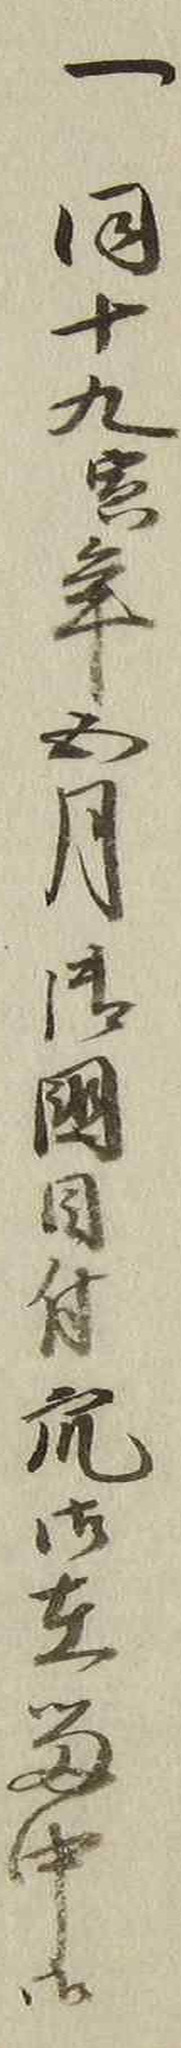一同十九寅年五月御国目付衆御在留中御
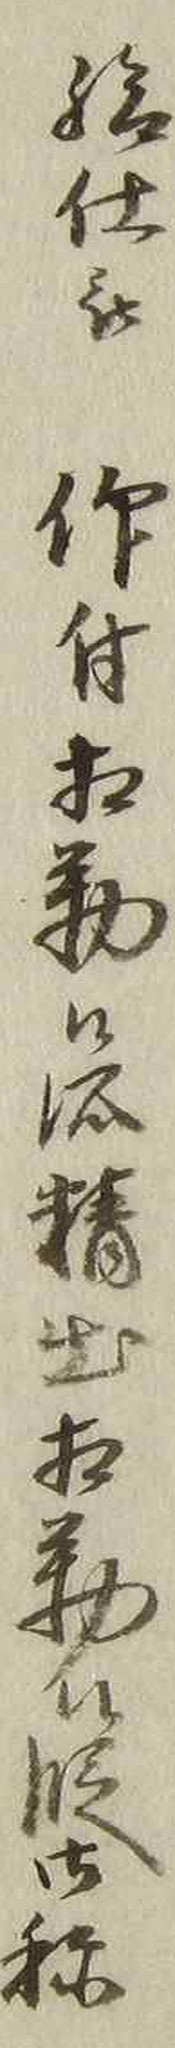給仕被仰付相勤候所精出相勤候段御称
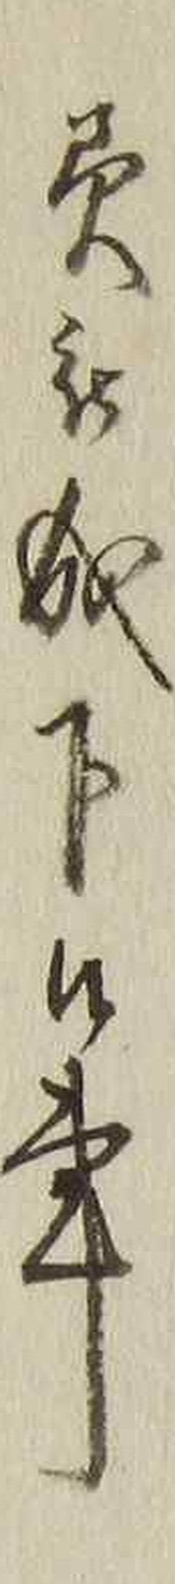美被成下候事
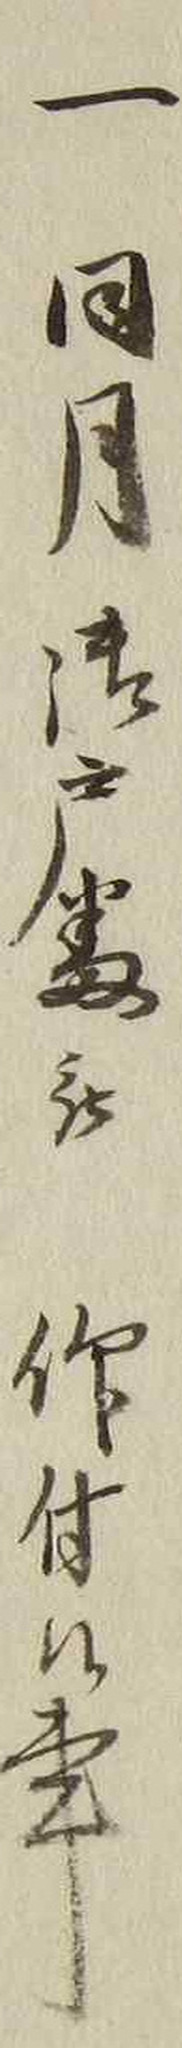一同月御戸番被仰付候事
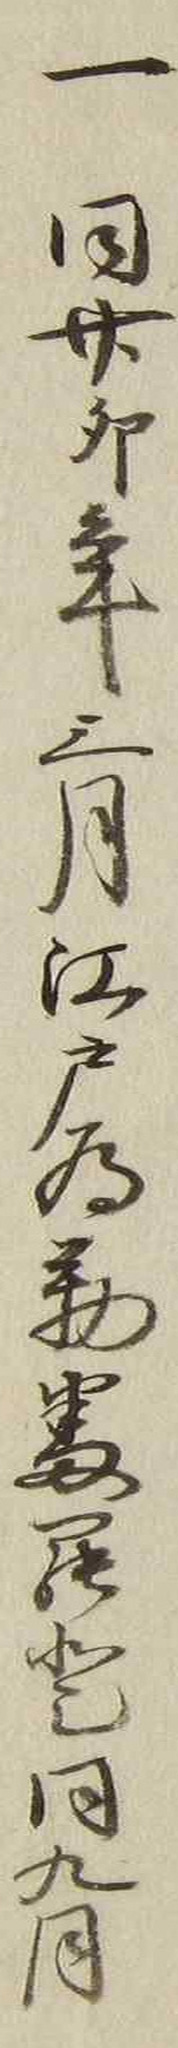一同廿卯年三月江戸為勤番罷登同九月
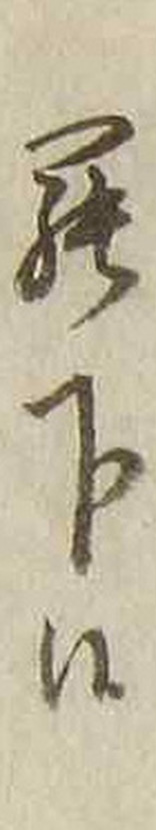罷下候
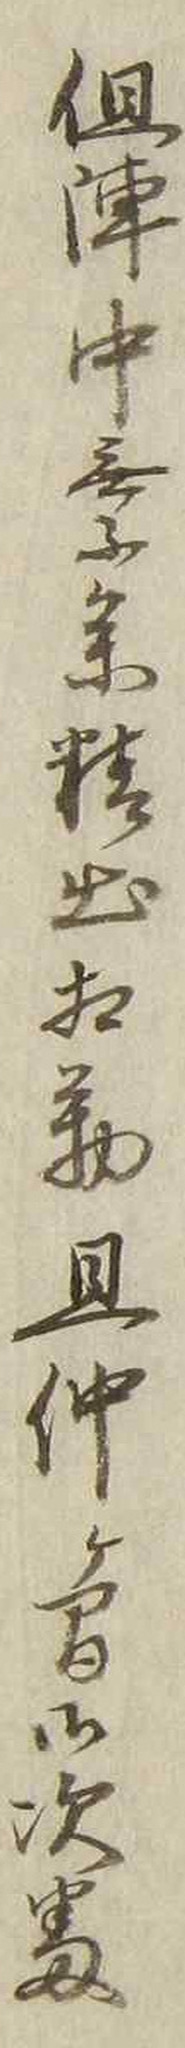但陣中無不参精出相勤且仲ケ間御次番

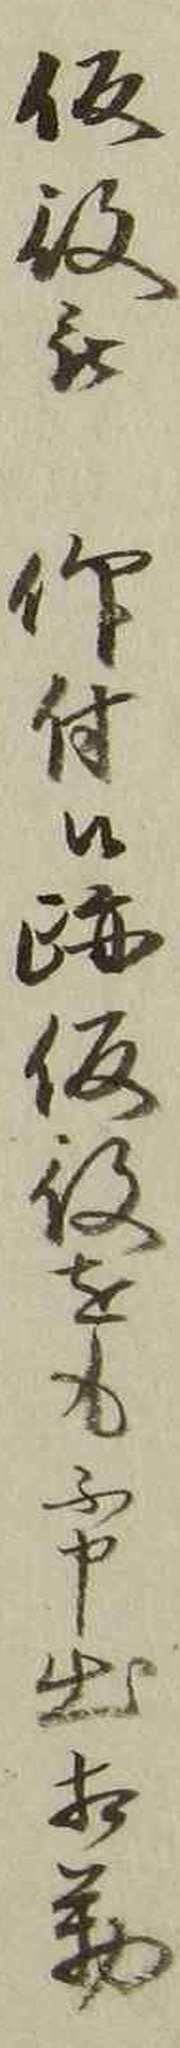仮役被仰付候跡仮役をも不申出相勤
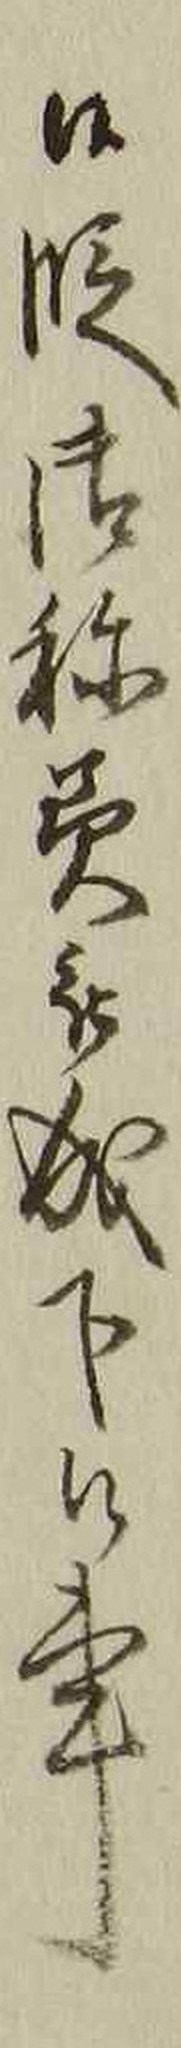候段御称美被成下候事
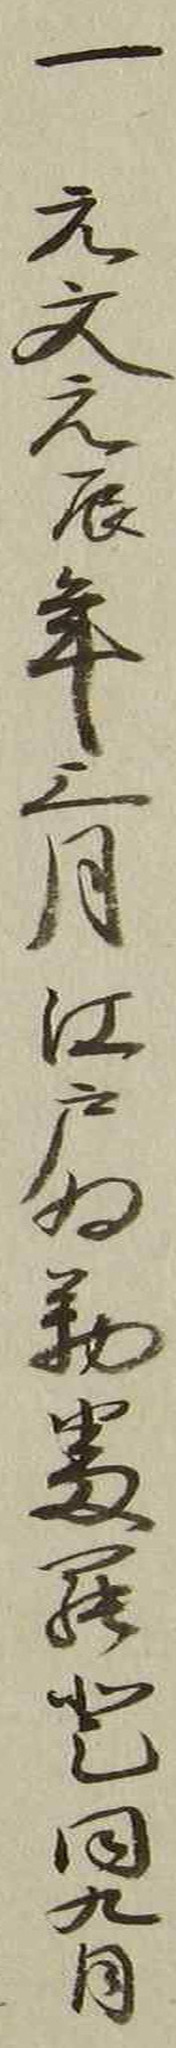一元文元辰年三月江戸為勤番罷登同九月
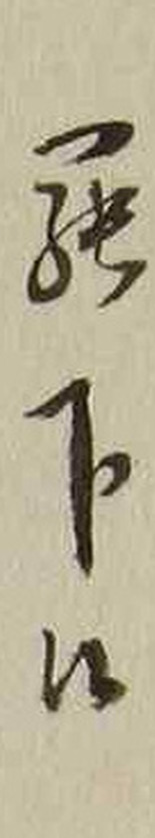罷下候
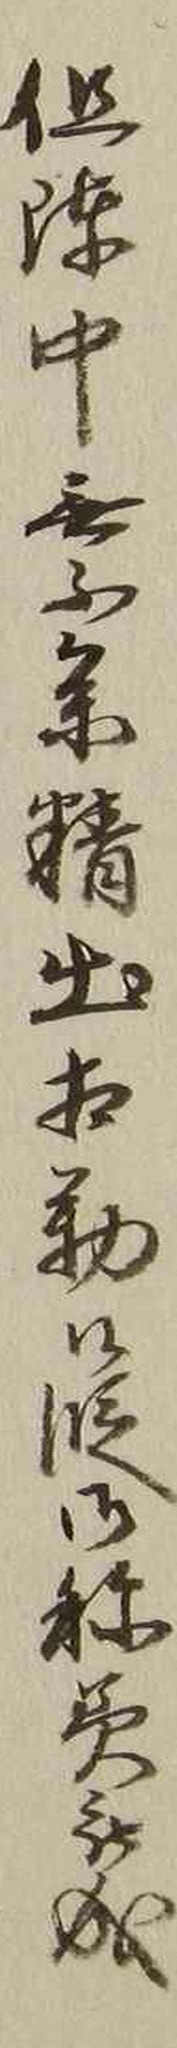但陣中無不参精出相勤候段御称美被成
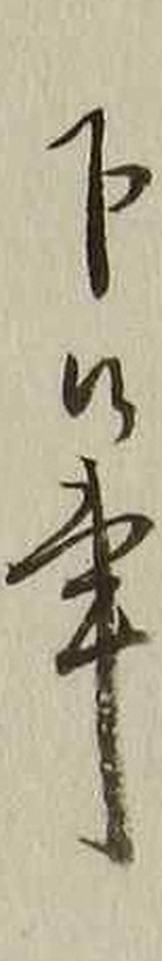下候事
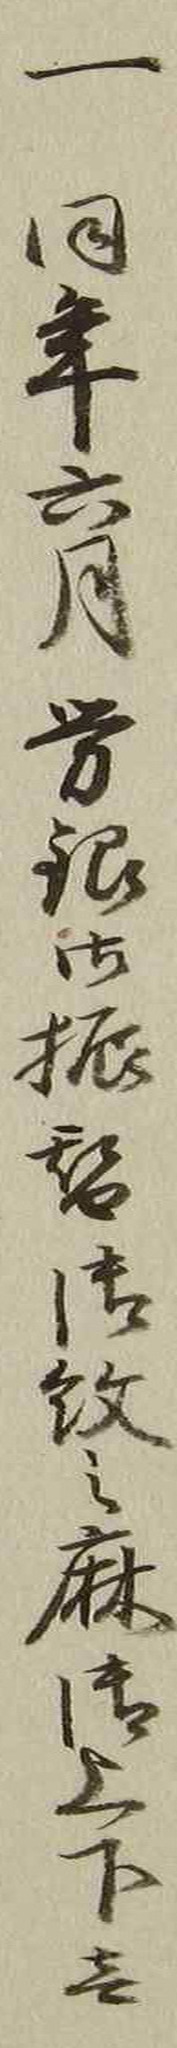一同年六月労銀御振替御紋之麻御上下壱
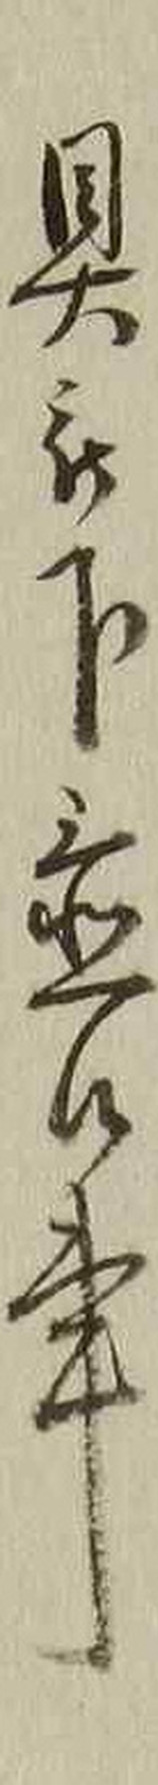具被下置候事
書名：諸士系譜　巻之128　た之部4
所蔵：会津若松市立会津図書館
